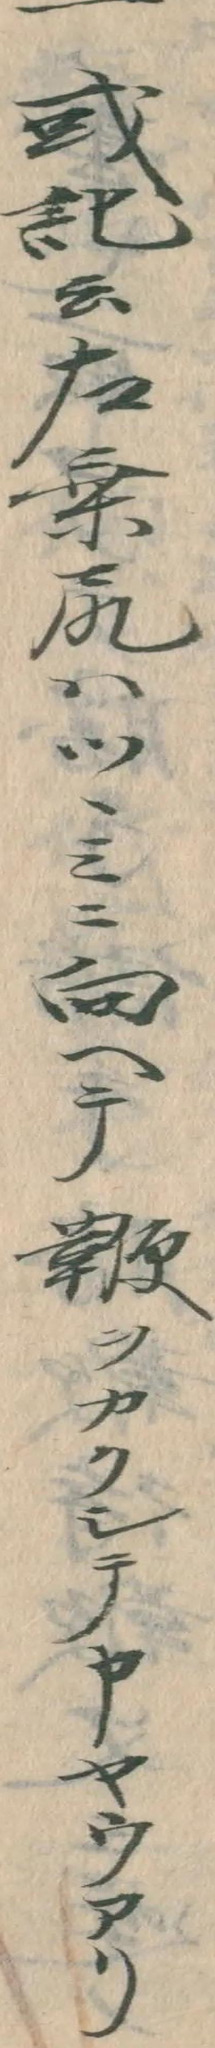一或記云左乗尻ハツヽミニ向ヘテ鞭ヲカクシテ申ヤウアリ
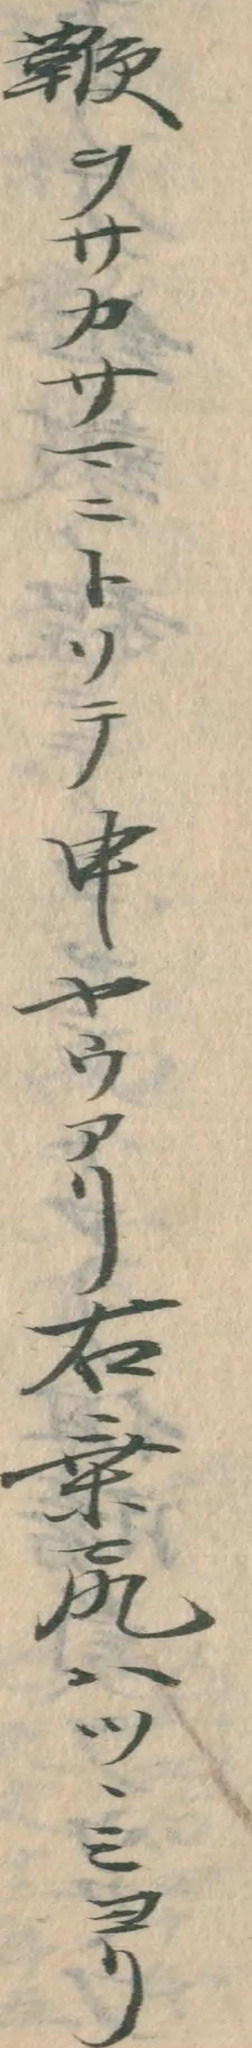鞭ヲサカサマニトリテ申ヤウアリ右乗尻ハツヽミヨリ

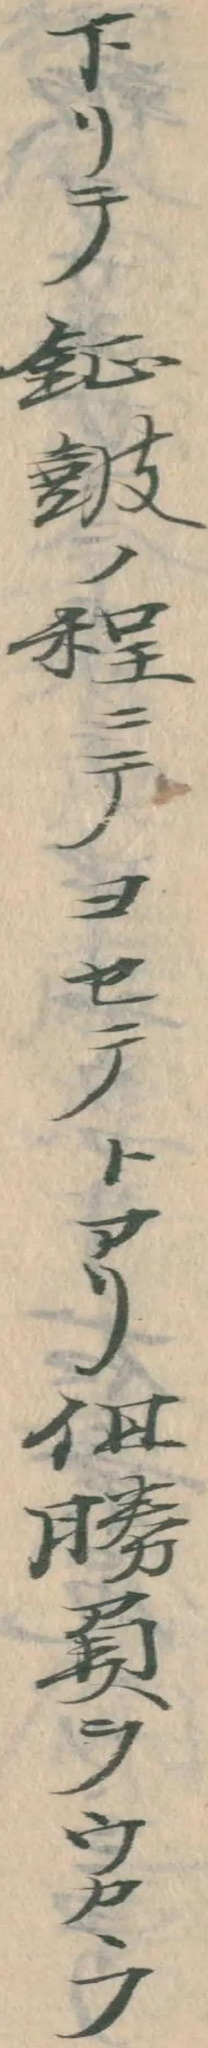下リテ鉦鼓ノ程ニテヨセテトアリ但勝負ヲウカヽフ
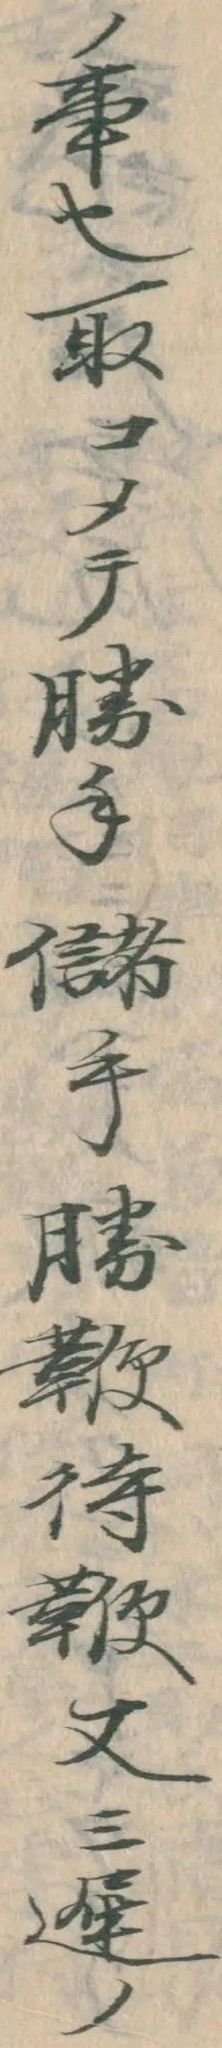ノ事也取コメテ勝手儲手勝鞭待鞭又三遅ノ
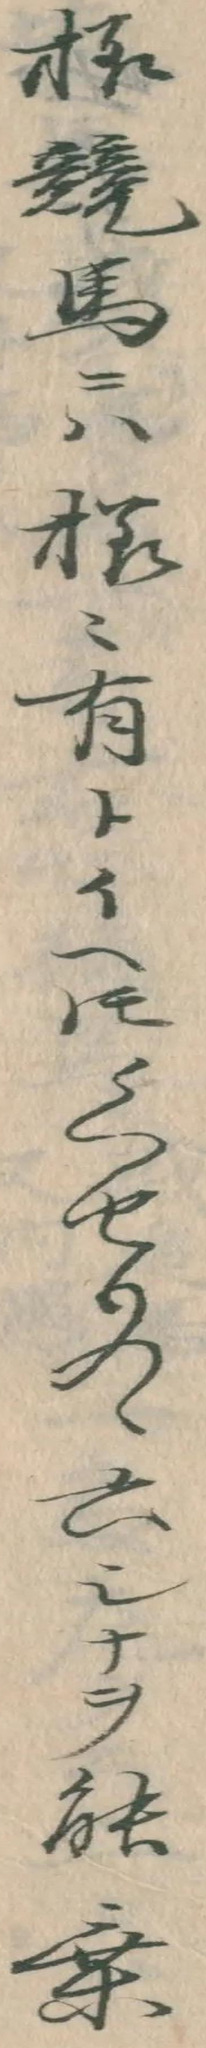様競馬ニハ様々有トイヘトモくせわものゝ六シナヲ能乗
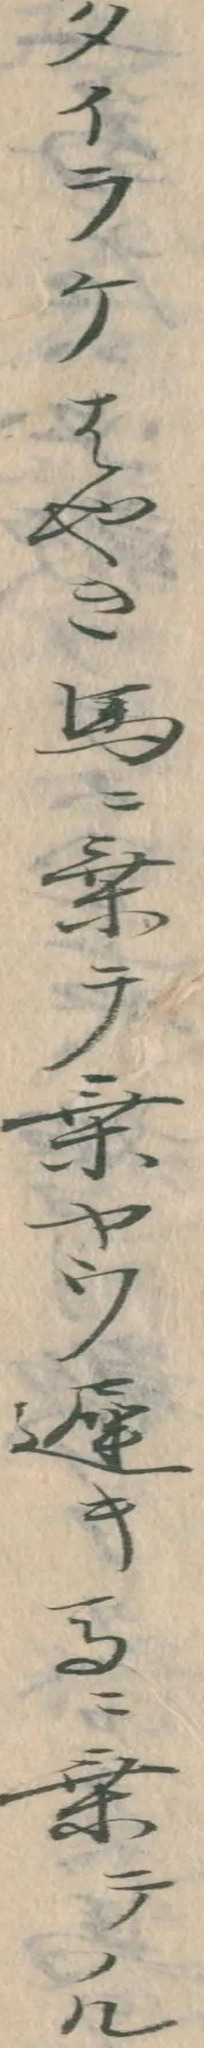タイラケはやき馬ニ乗テ葉ヤウ遅キ馬ニ乗テノル
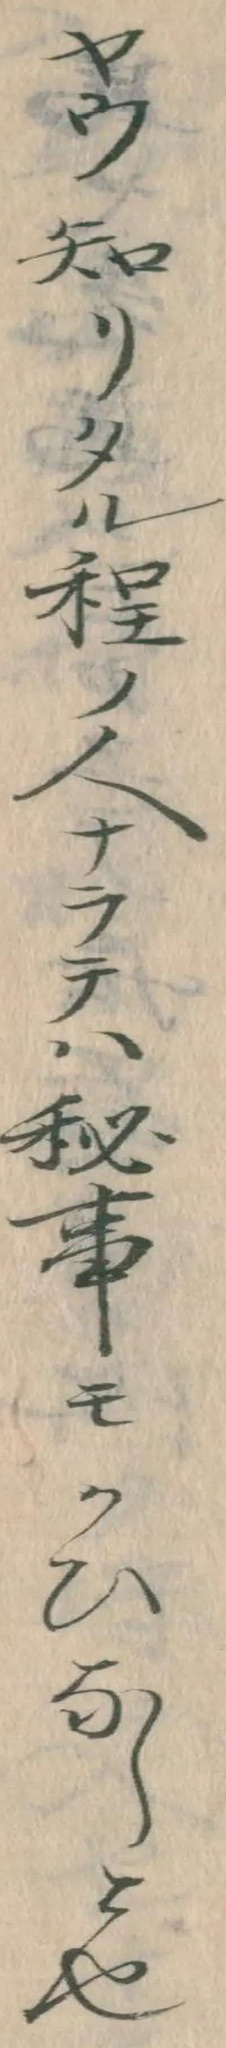ヤウ知リタル程ノ人ナラテハ秘事モかひなしと也
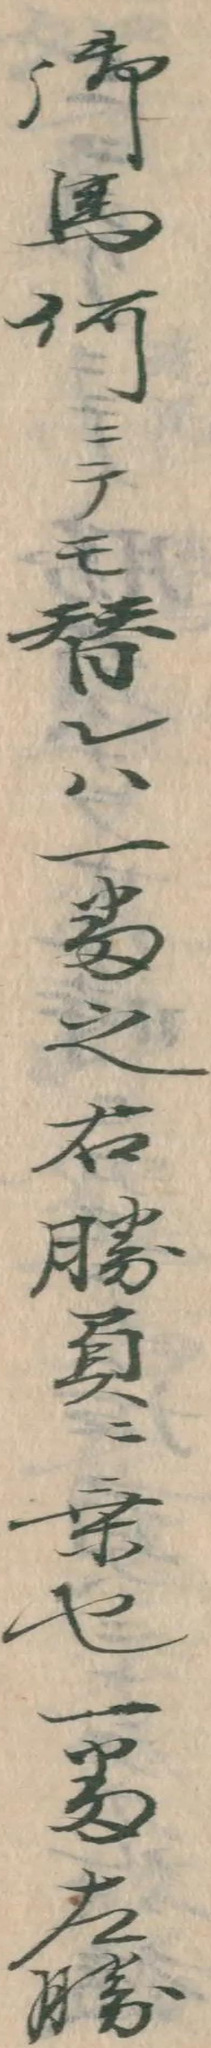一御馬何ニテモ替レハ一番之右勝負ニ乗也一番左勝
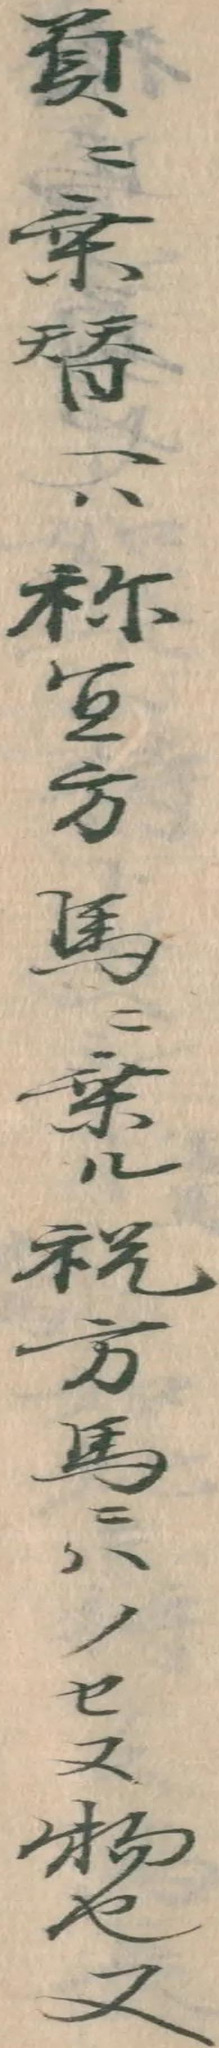負ニ乗替ヘハ禰宜方馬ニ乗ル祝方馬ニハノセヌ物也又
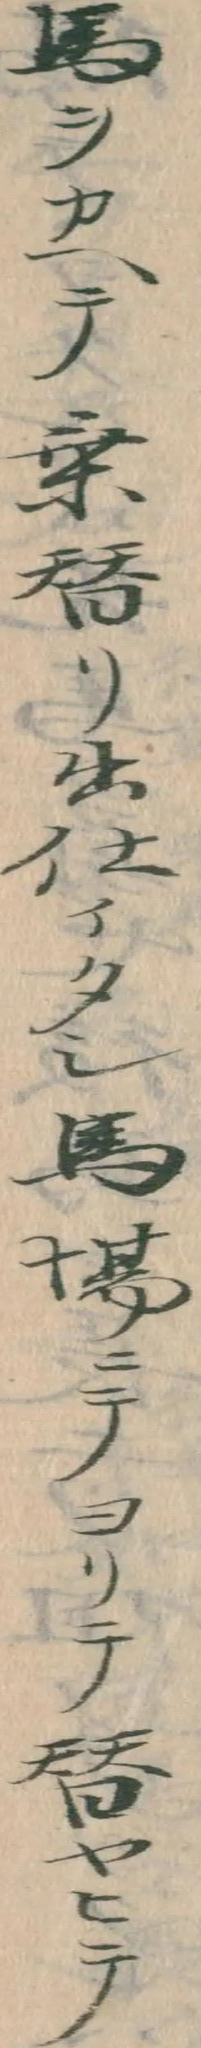馬ヲカヘテ乗替リ出仕イタシ馬場ニテヨリテ替ヤヒテ
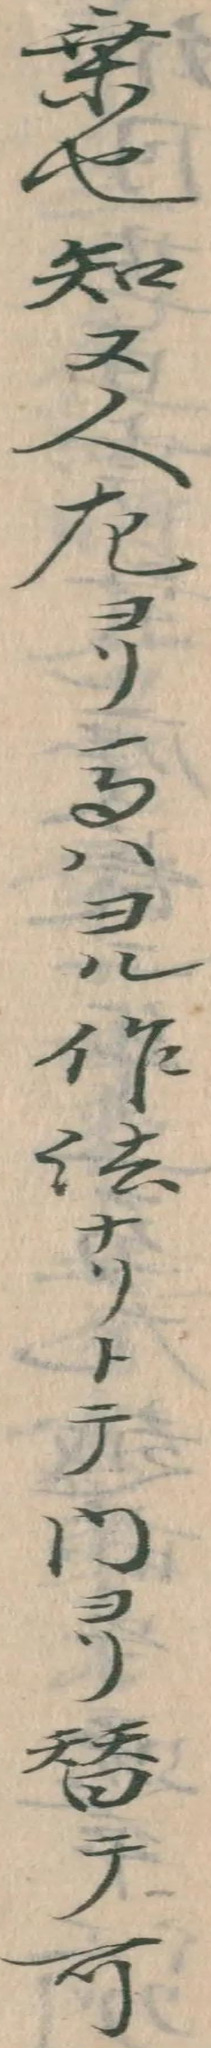乗也知ヌ人左ヨリ馬ハヨル作法ナリトテ門ヨリ替テ可
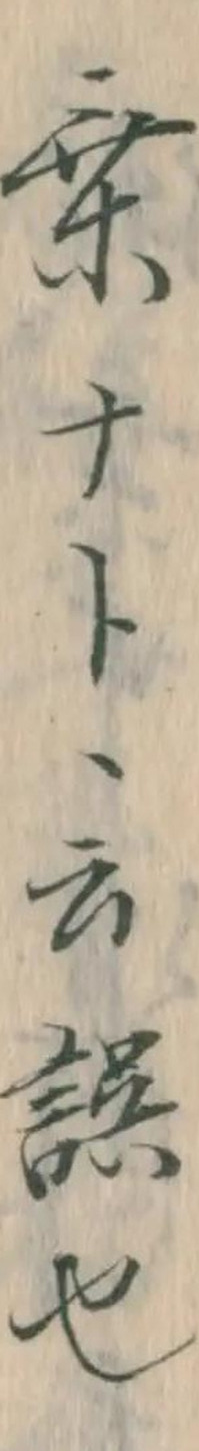乗ナトヽ云誤也
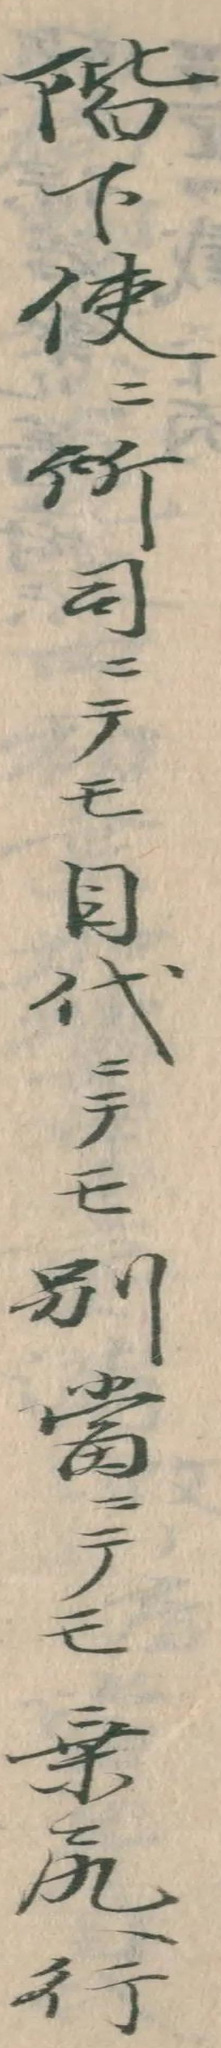一階下使ニ所司ニテモ目代ニテモ別当ニテモ乗尻へ行
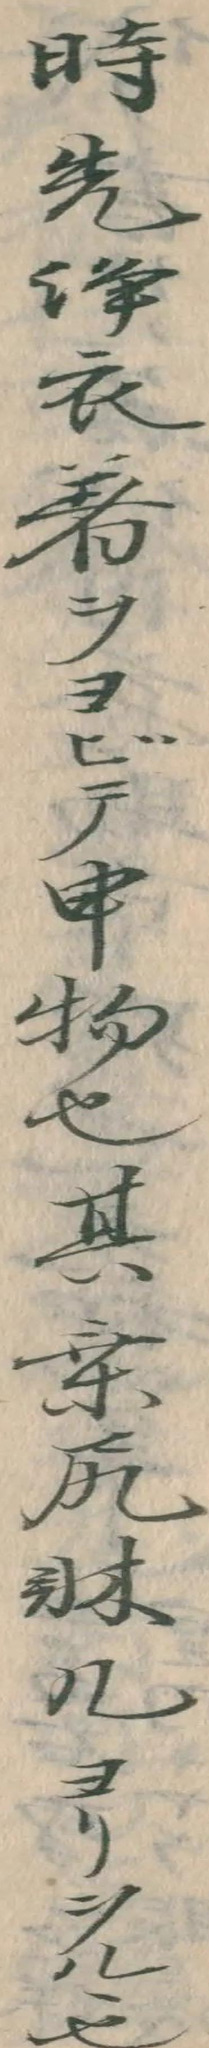時先浄衣着ヲヨビテ申物也其乗尻牀几ヨリヲルヽ也
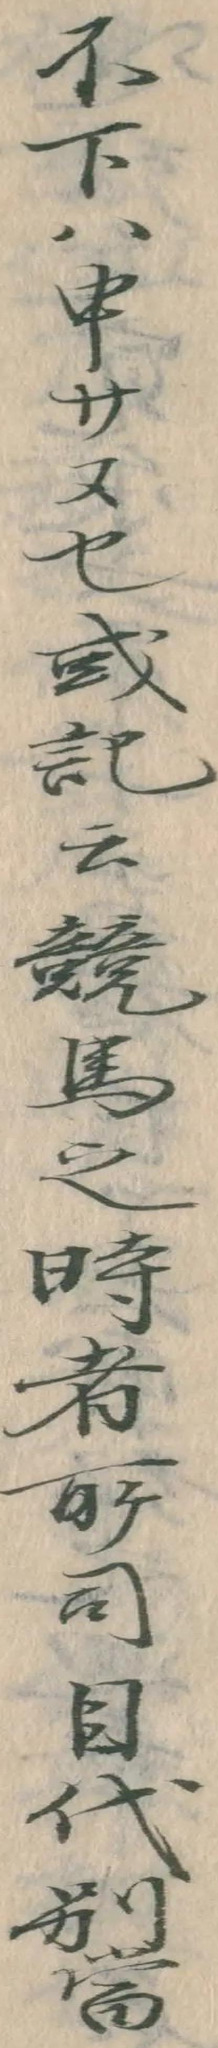不下ハ申サヌ也或記云競馬之時者所司目代別当
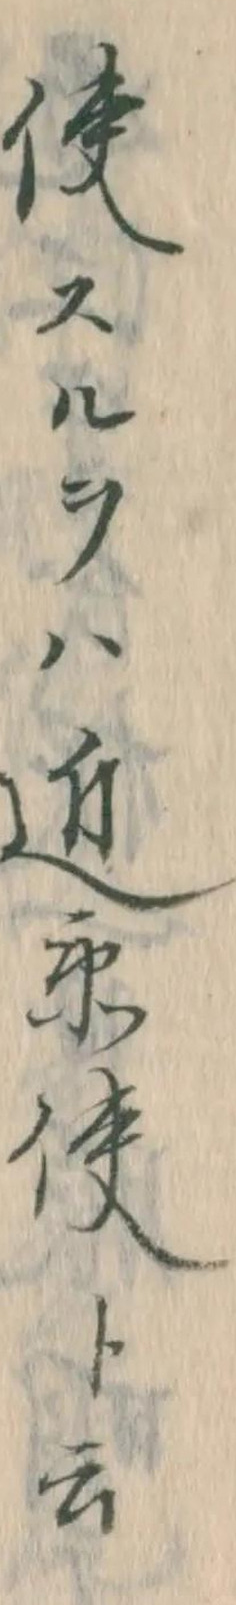使スルヲハ近衛使ト云
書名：賀茂社記録. 第11冊
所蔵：国立国会図書館 National Diet Library, JAPAN
